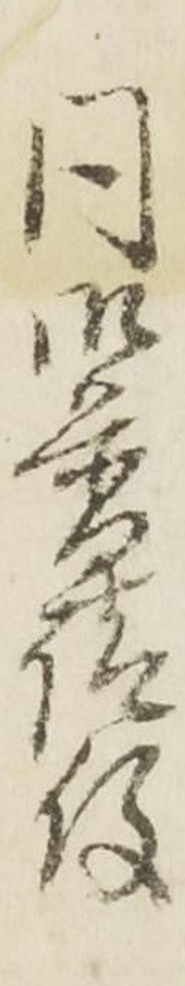同御普請役
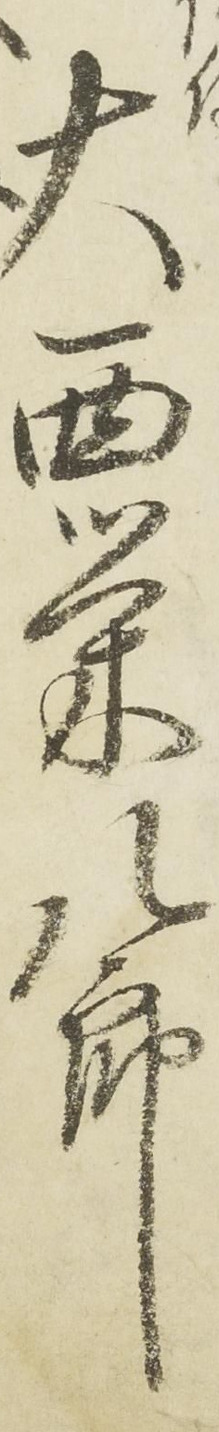大西栄八郎
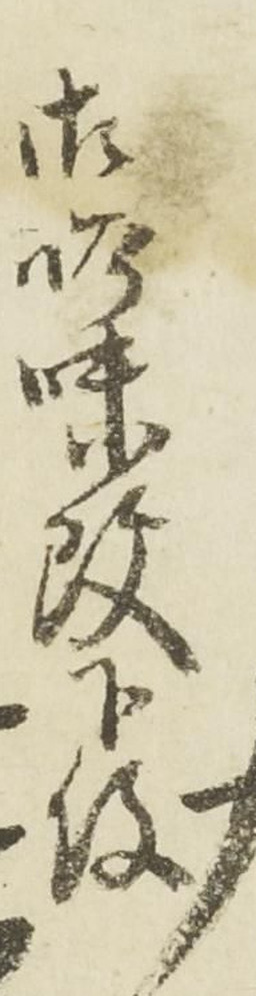御吟味改下役
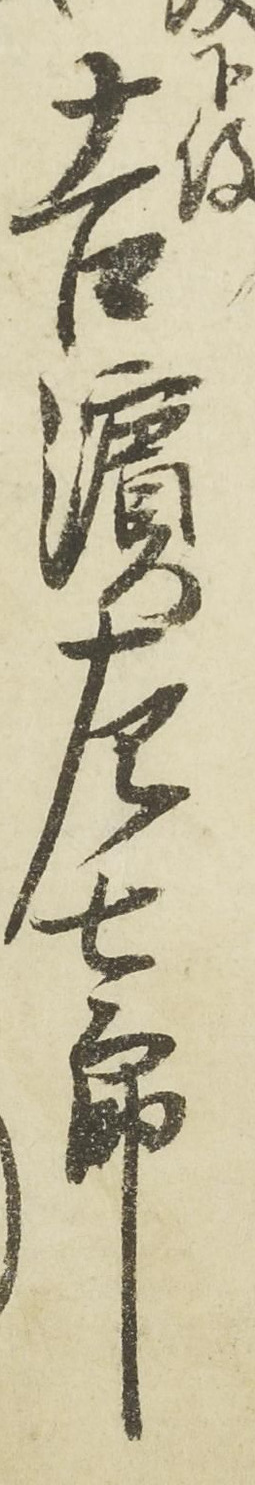吉浜左七郎
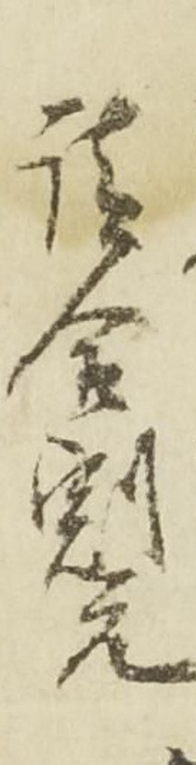請合割元
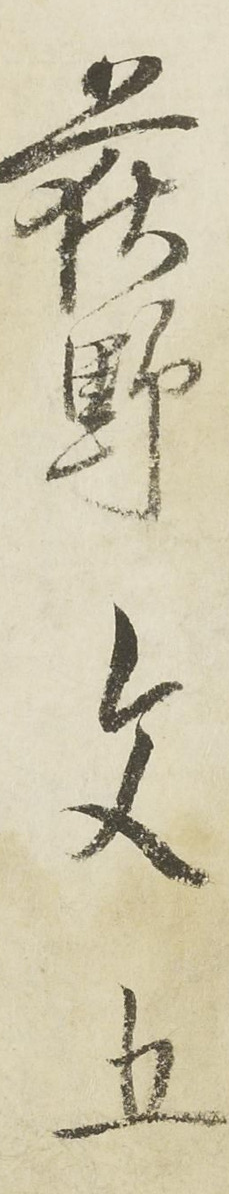萩野文五
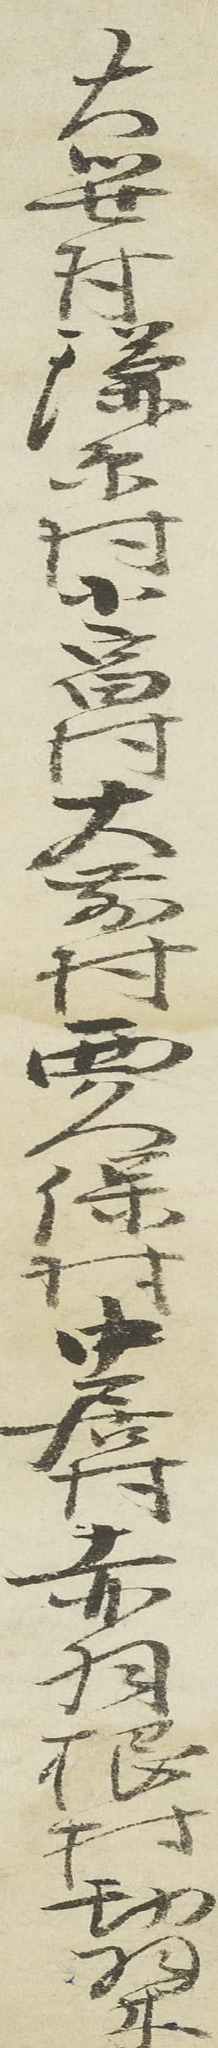大笹村鎌原村小富村大前村西久保村中居村赤羽根村切羽木
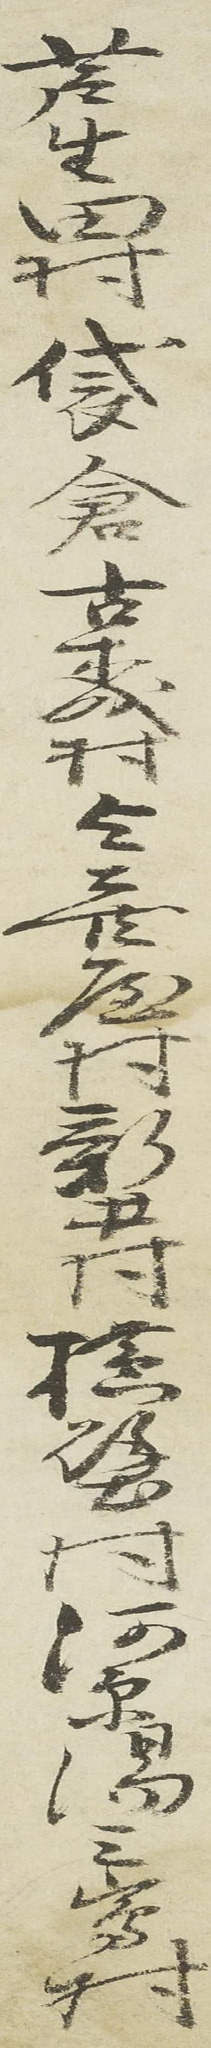芦生田村袋倉古森村与喜屋村新井村横壁村河原湯三嶋村
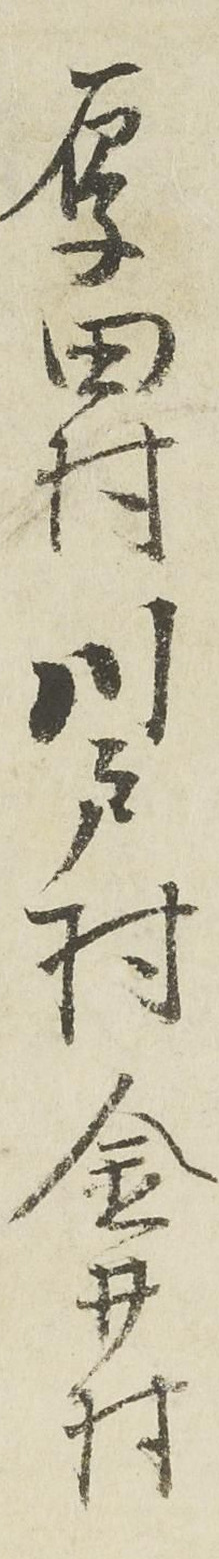原田村川戸村金井村
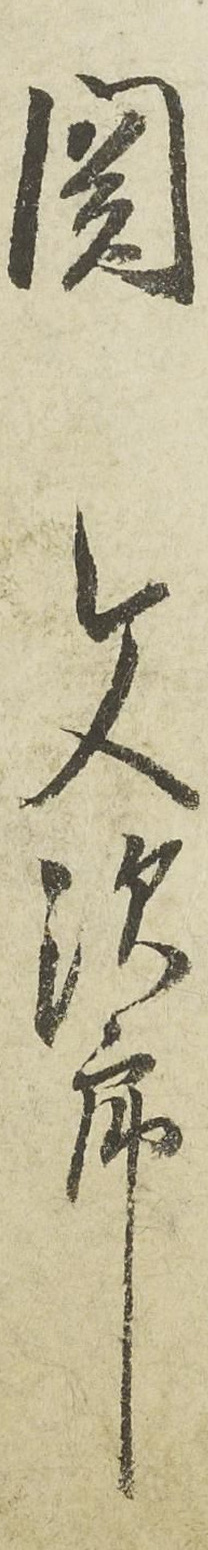関文次郎

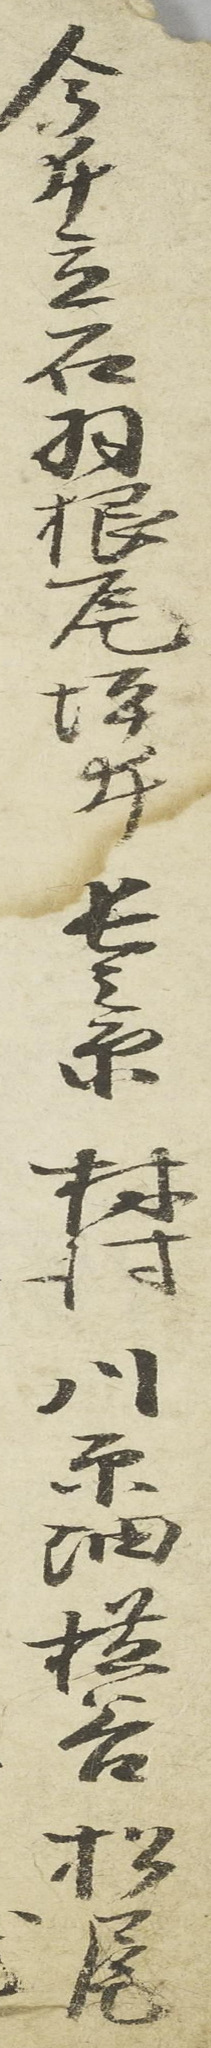今井立石羽根尾坪井長の原林村川原畑横谷松尾
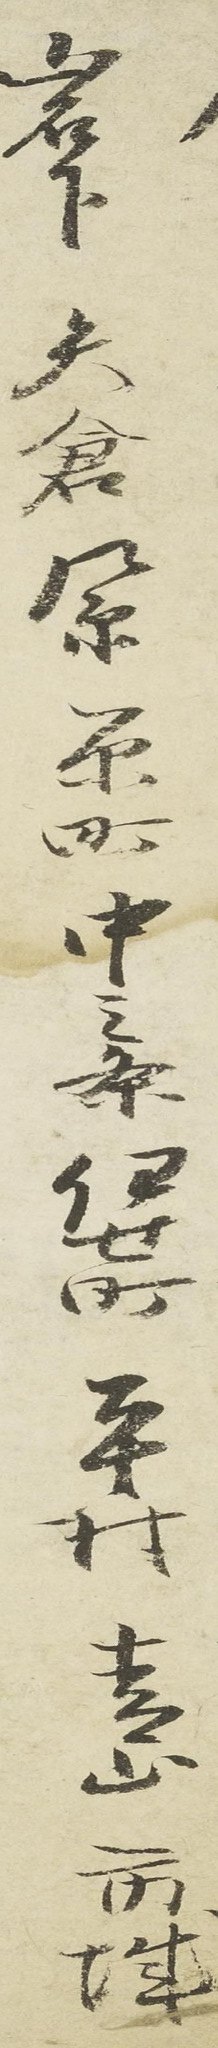岩下矢倉郷原原町中の条伊せ町平村青山市城
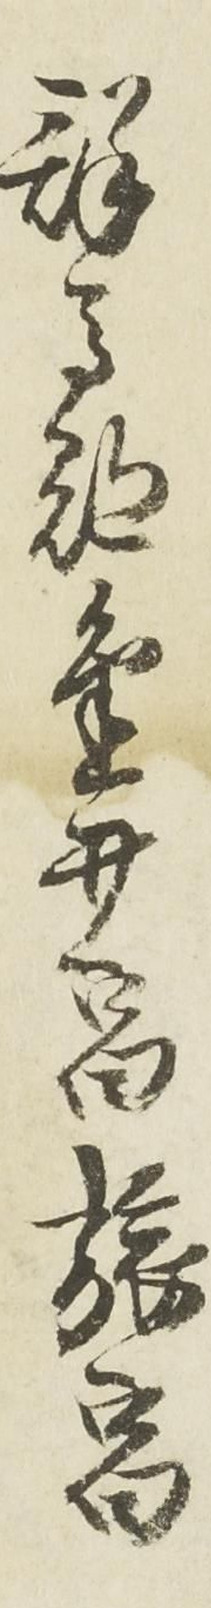群馬郡金井宿旅宿
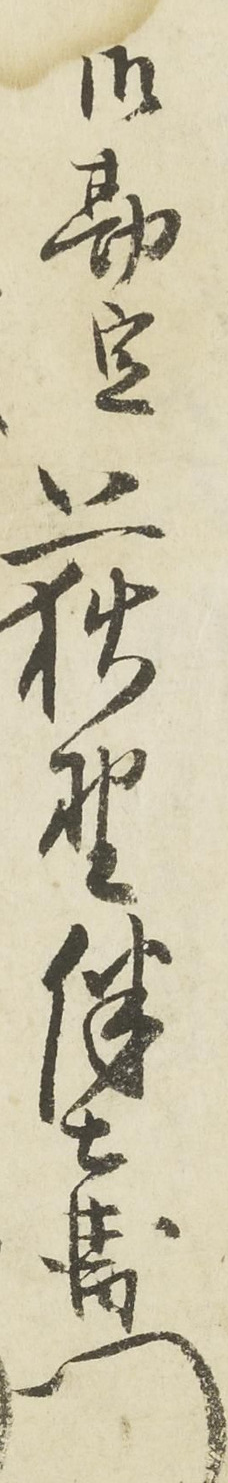御勘定萩野伴右衛門
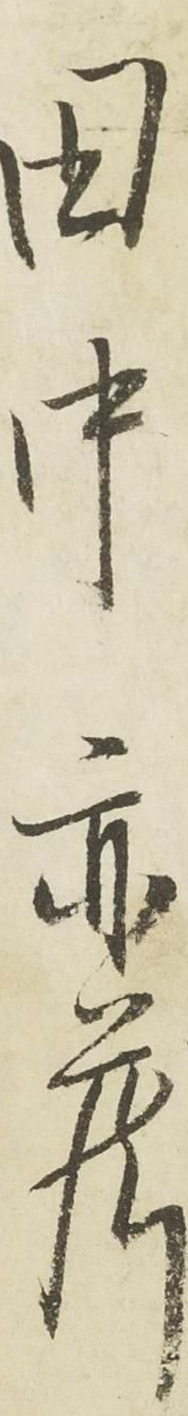田中亦蔵
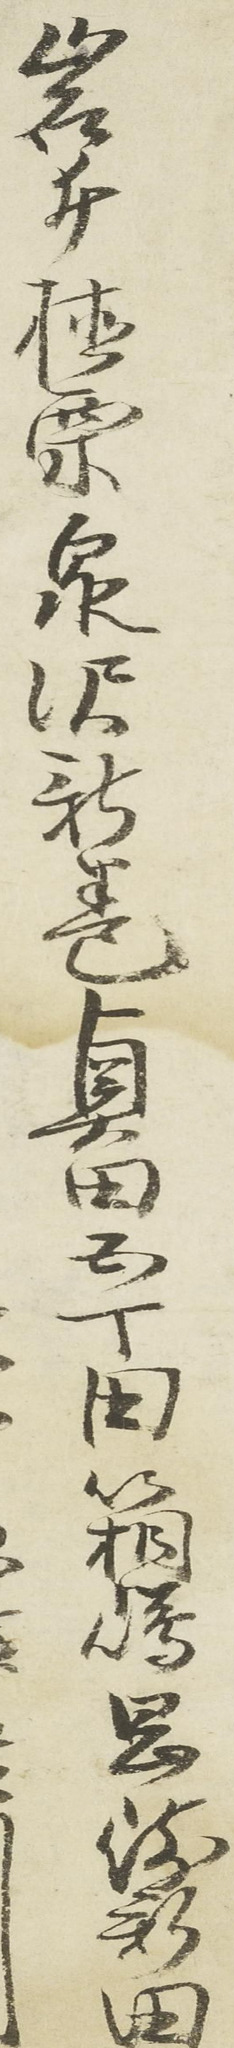岩井植栗泉沢新巻奥田五丁田箱嶋岡嶋新田
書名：浅間大変略記
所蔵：東京大学地震研究所図書室 Earthquake Research Institute Library, The University of Tokyo, JAPAN
